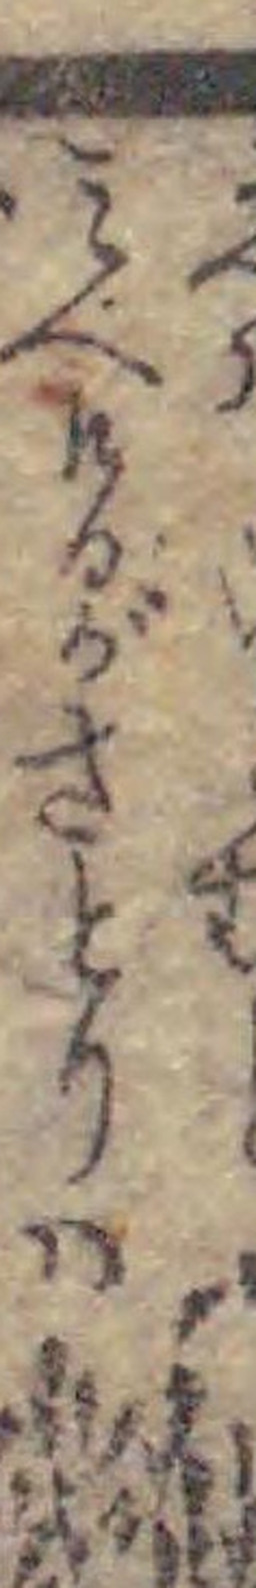みへけるがさとりは
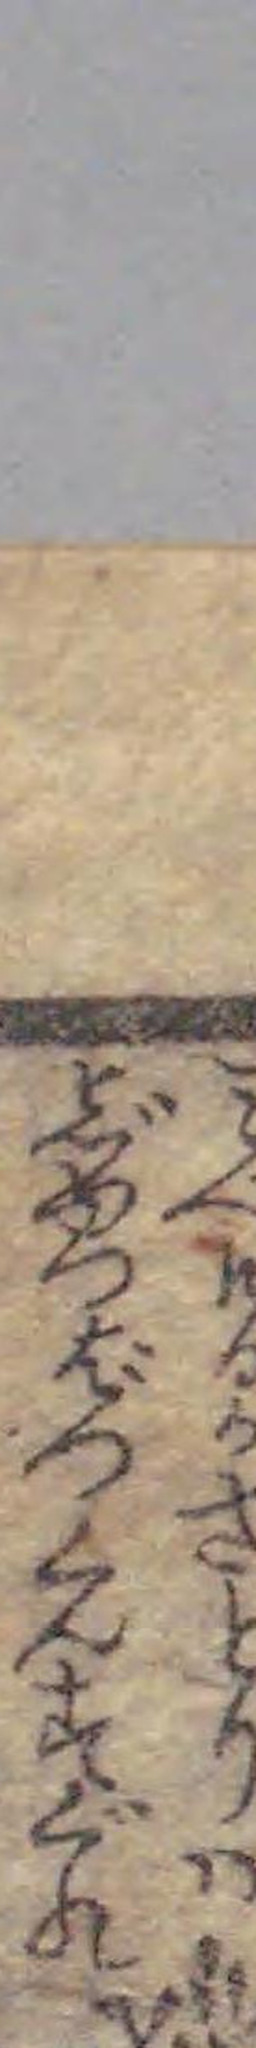じゆつばつくんすぐれ
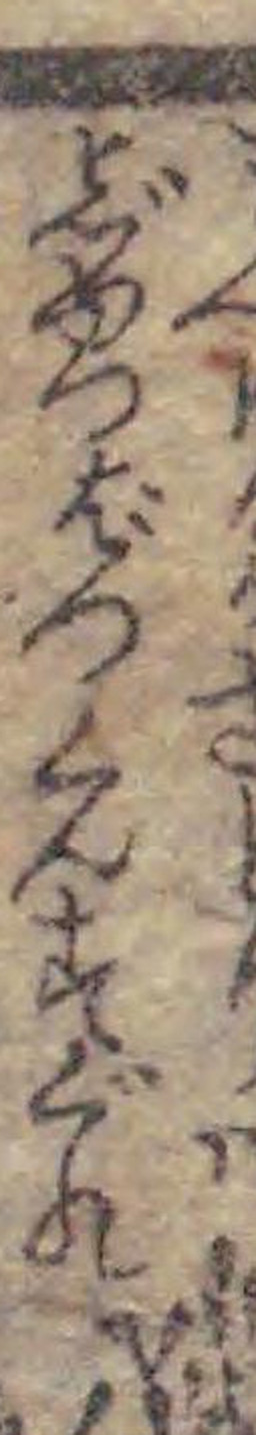じゆつばつくんすぐれ
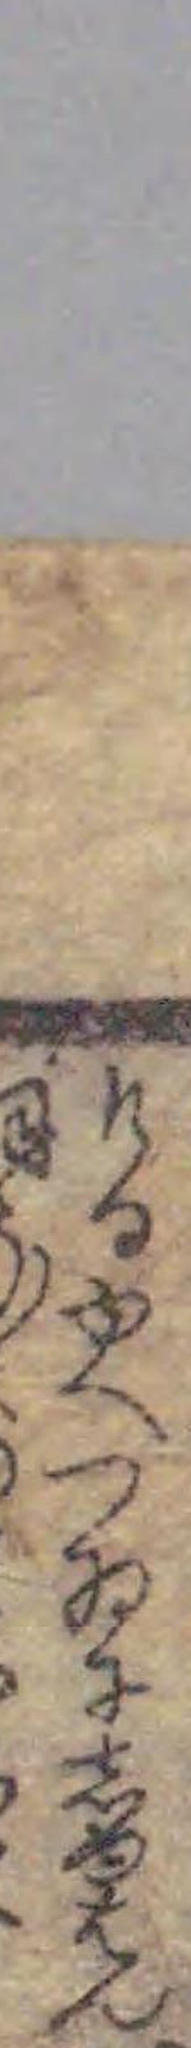けるゆへつゐにしゆはん
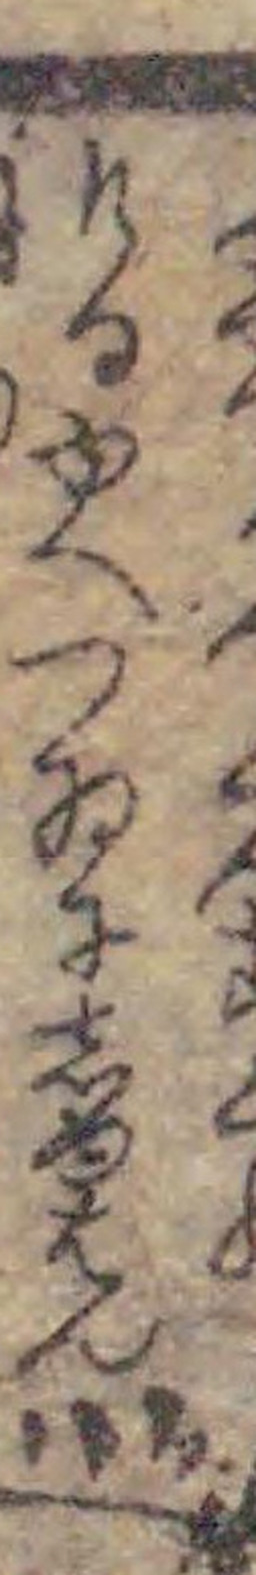けるゆへつゐにしゆはん
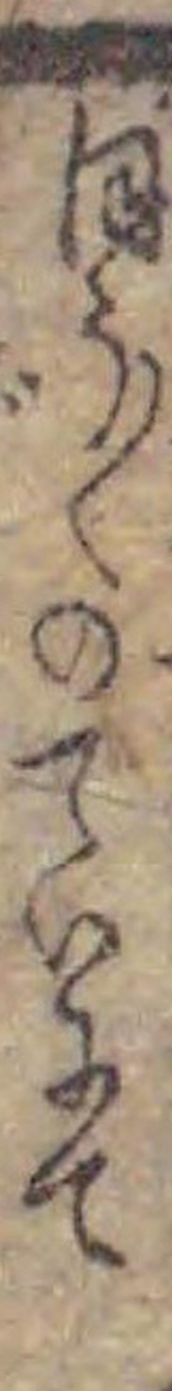ほう〳〵のていにて
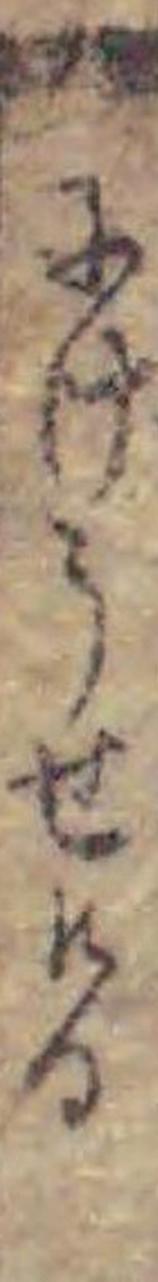にげうせける

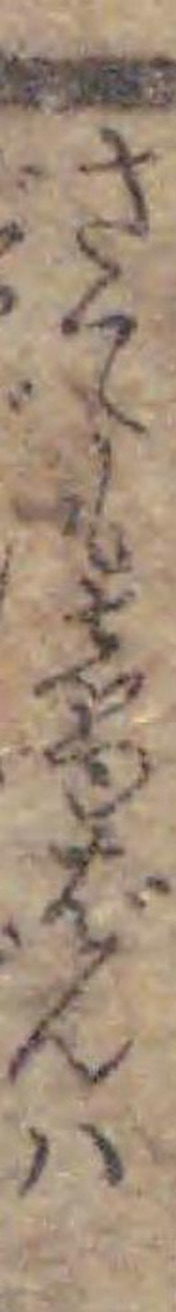さてもしゆばんは
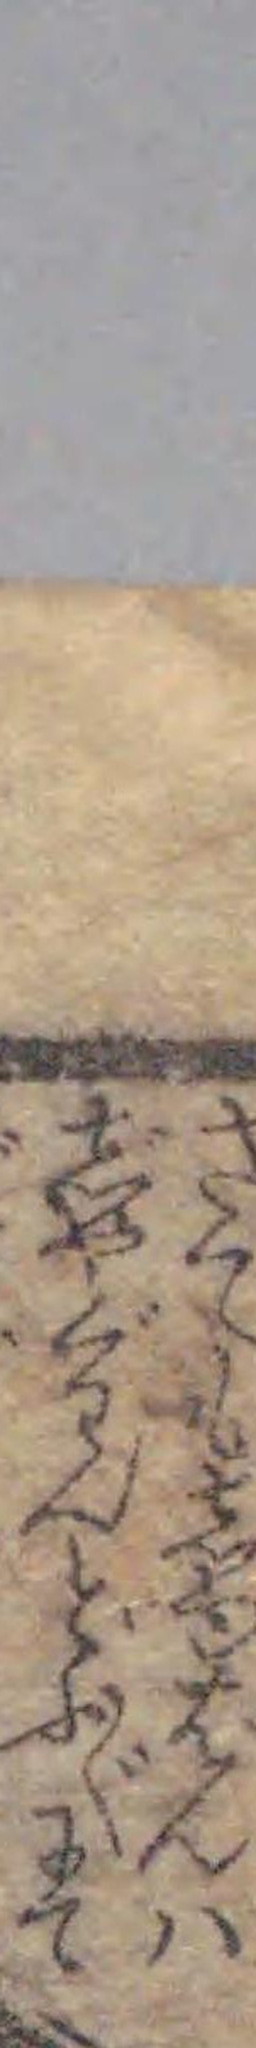しやぐわんどふ〴〵にて
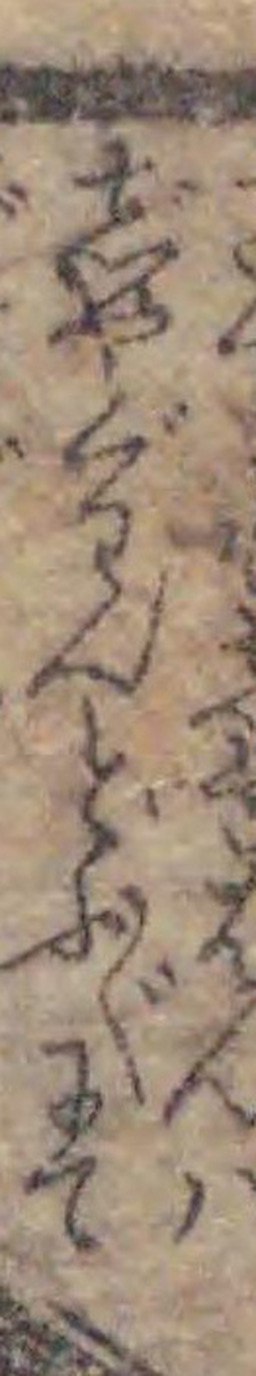しやぐわんどふ〴〵にて
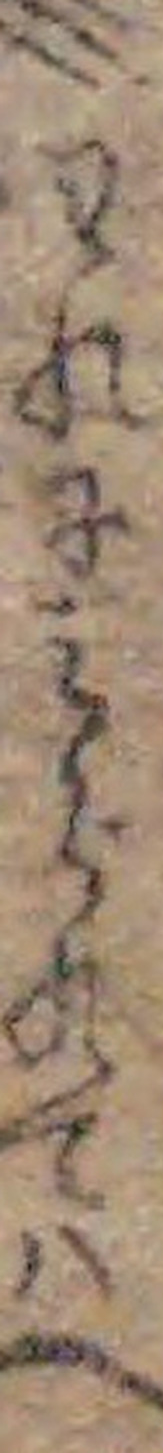われにみられては
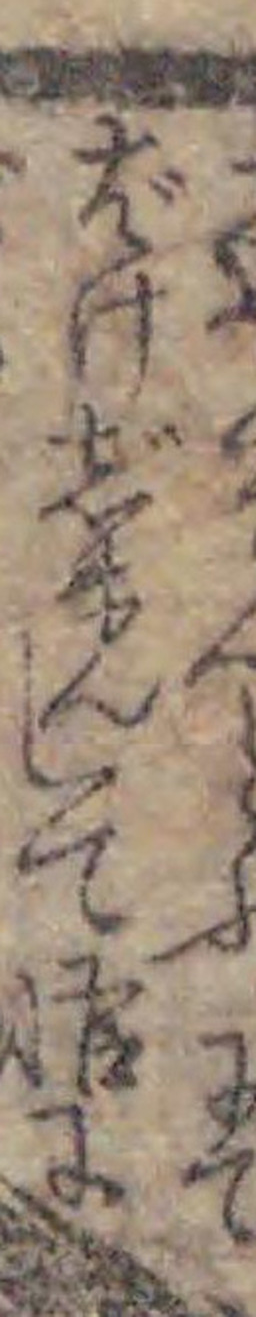ばけじまんして悟に
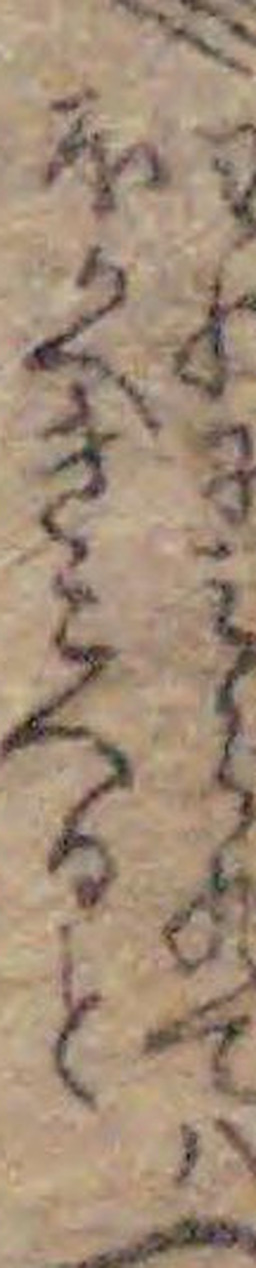ほかへきこへると
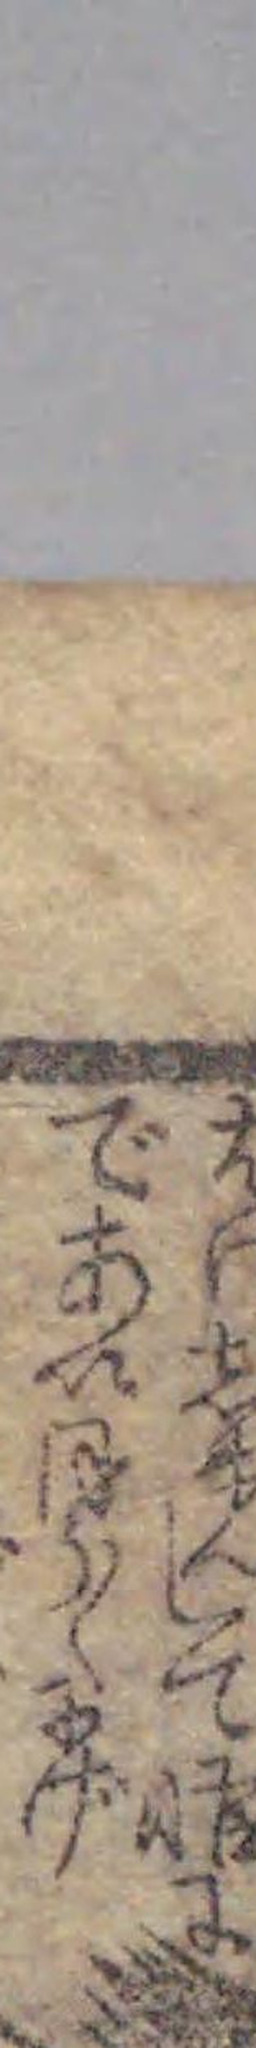であいほう〳〵にげ
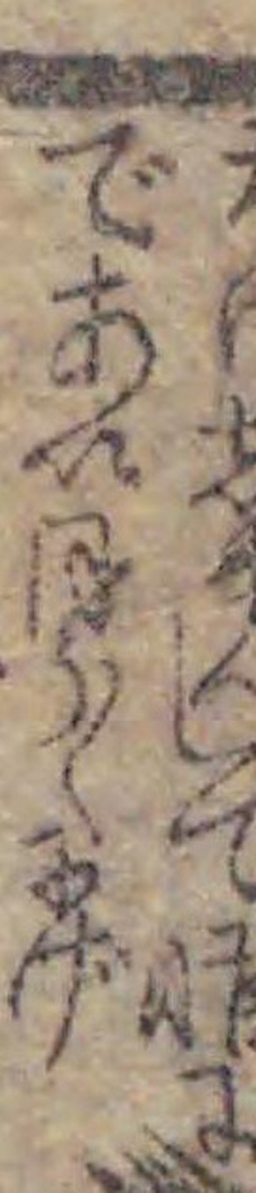であいほう〳〵にげ
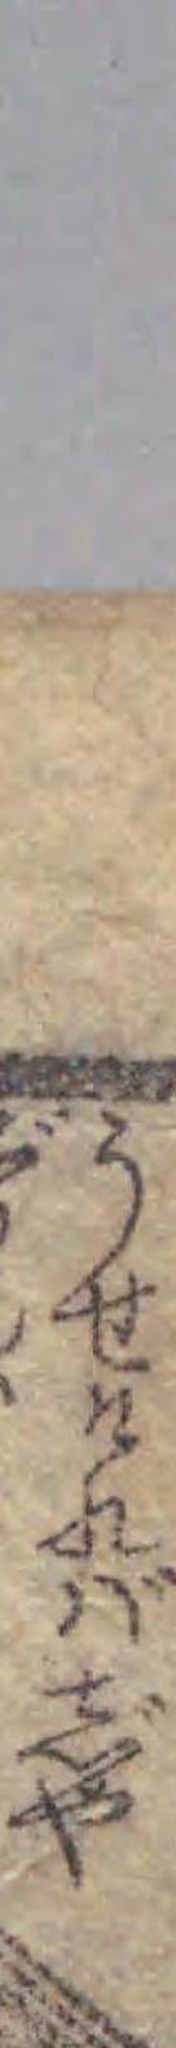うせければじや
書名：化物世界夜半嵐 : 3巻
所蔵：国立国会図書館 National Diet Library, JAPAN
